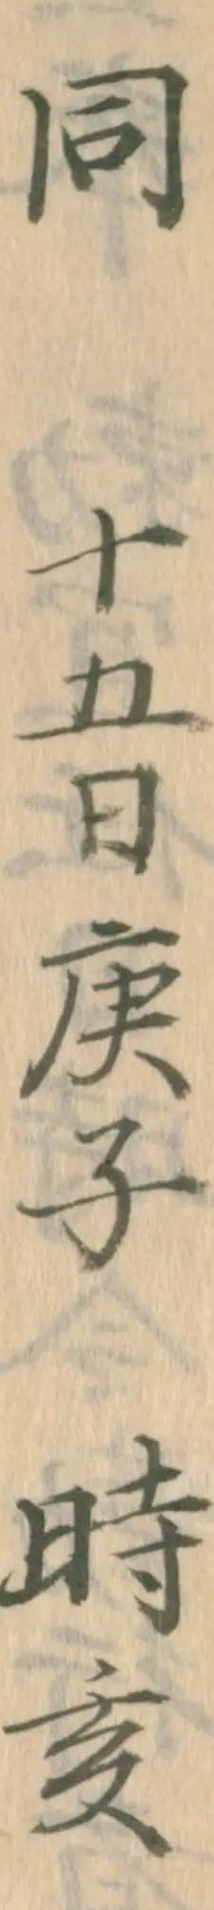同十五日庚子時亥
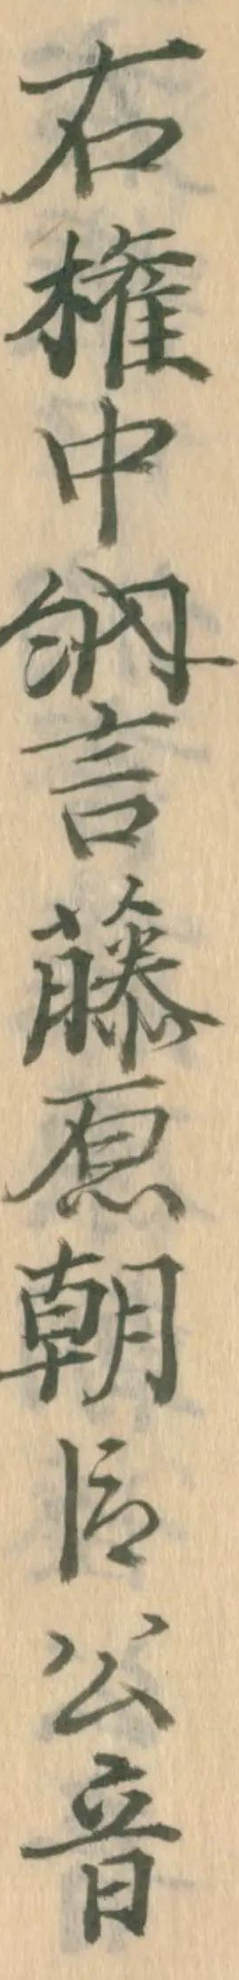右権中納言藤原朝臣公音
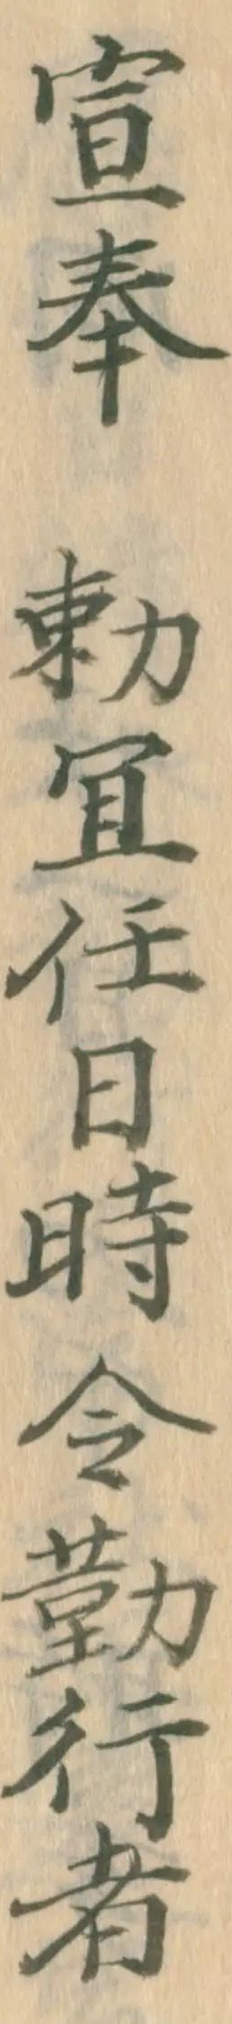宣奉勅宜任日時令勤行者
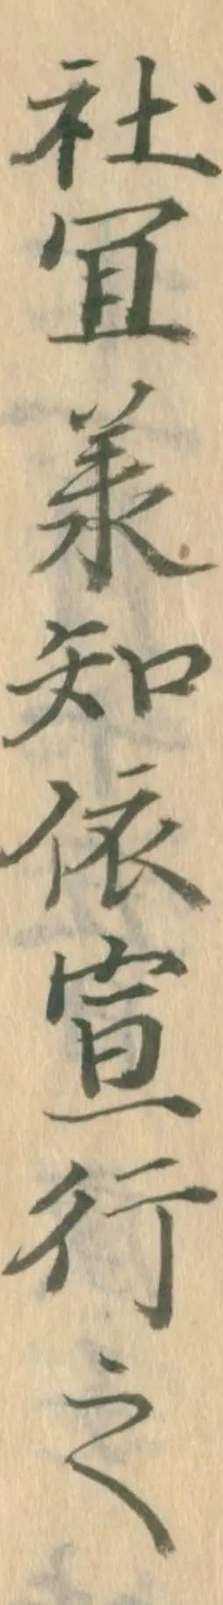社宜承知依宣行之
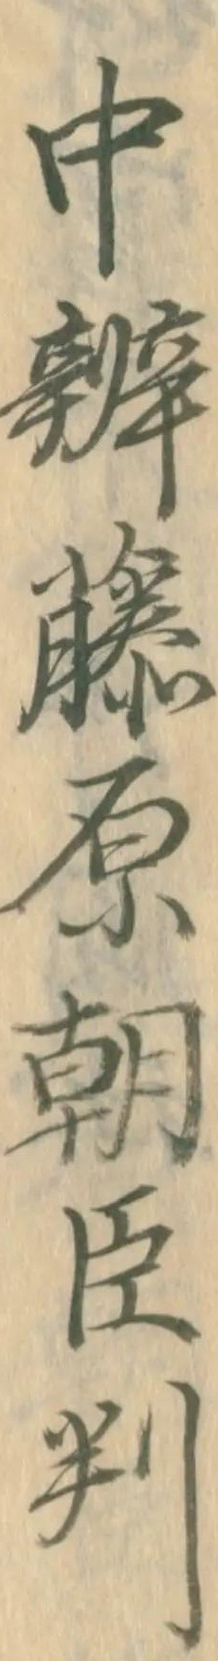中弁藤原朝臣判

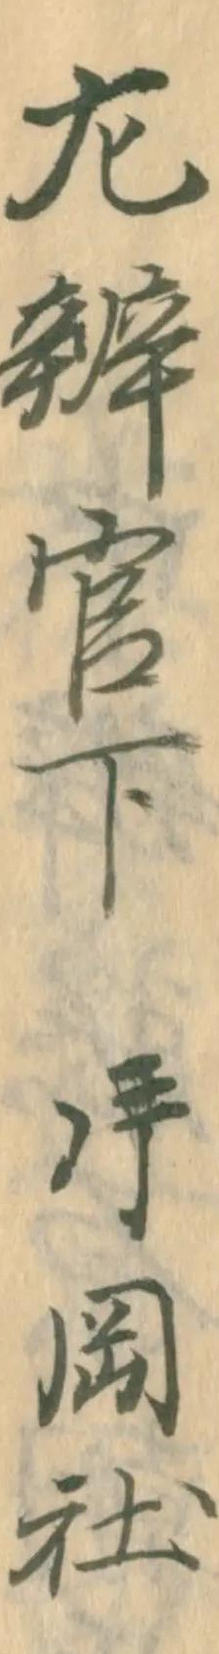左弁官下片岡社
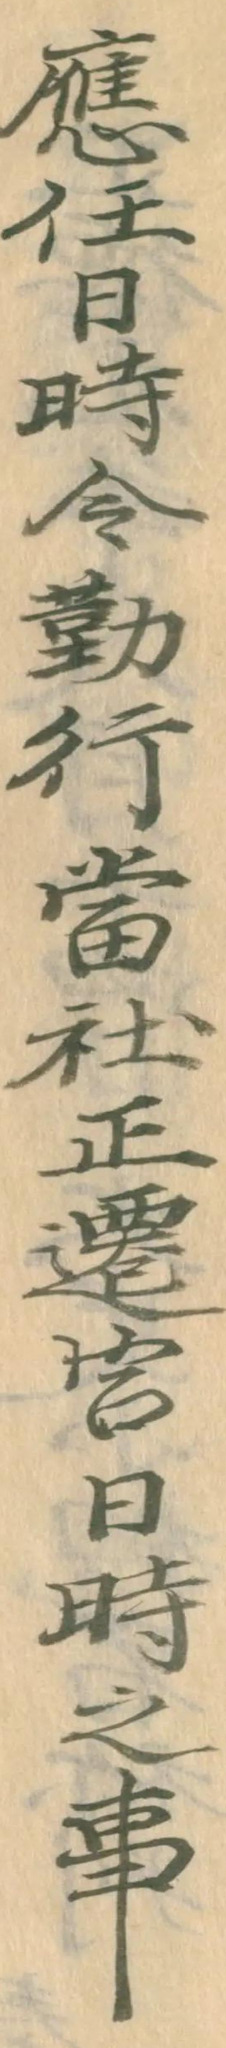応任日時令勤行当社正遷宮日時之事
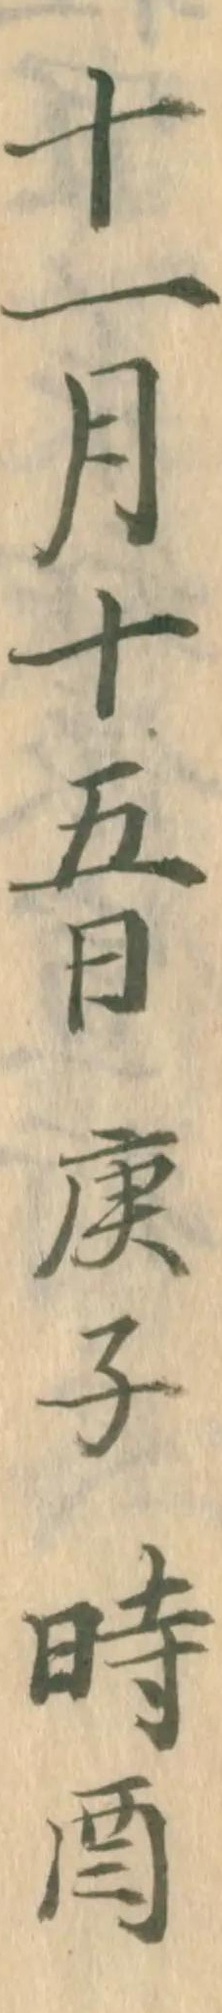十一月十五日庚子時酉
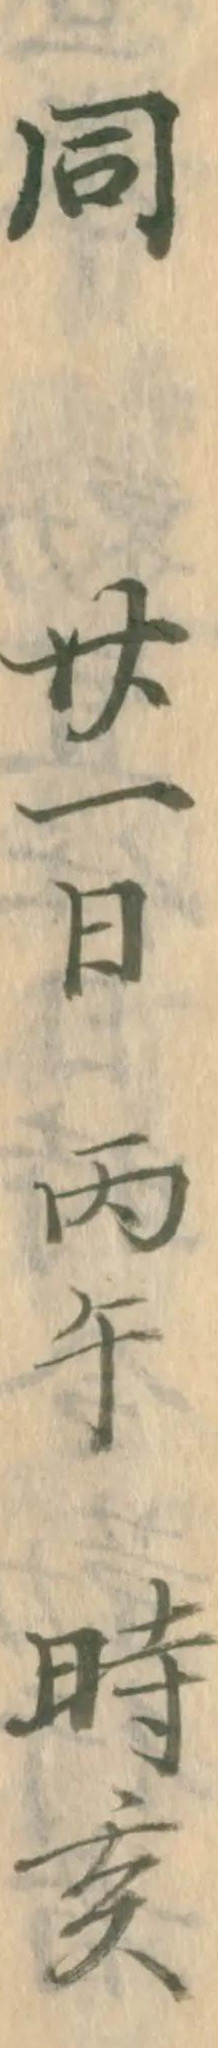同廿一日丙午時亥
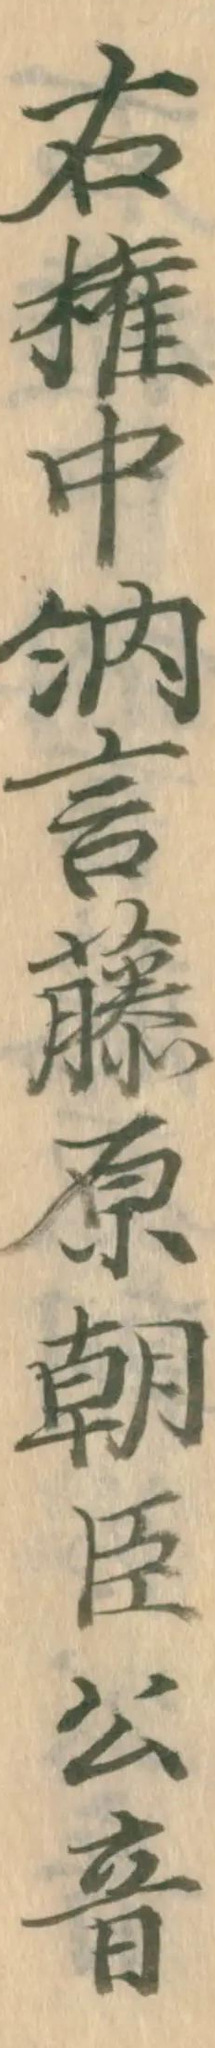右権中納言藤原朝臣公音
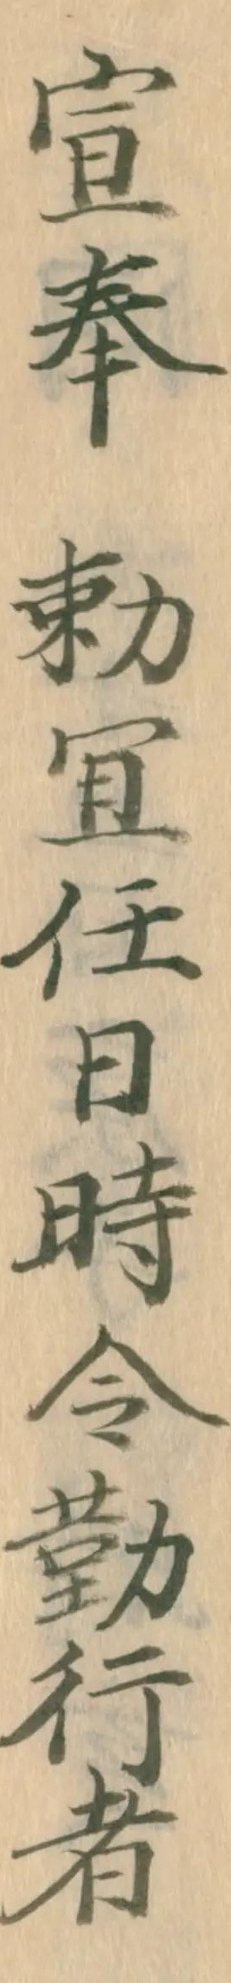宣奉勅宜任日時令勤行者
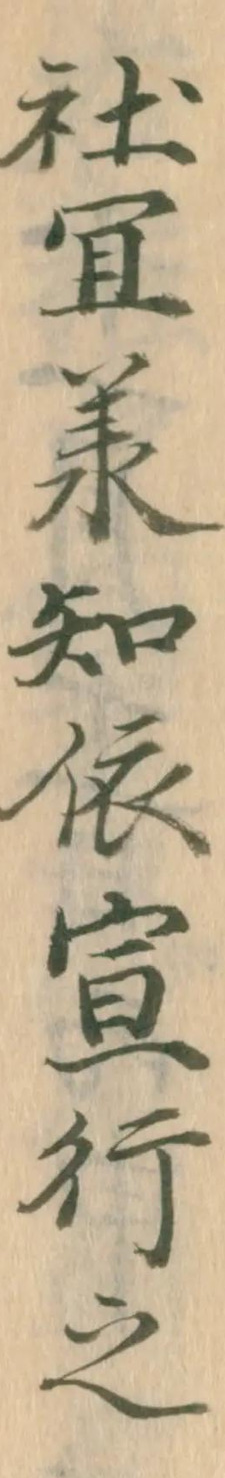社宜承知依宣行之
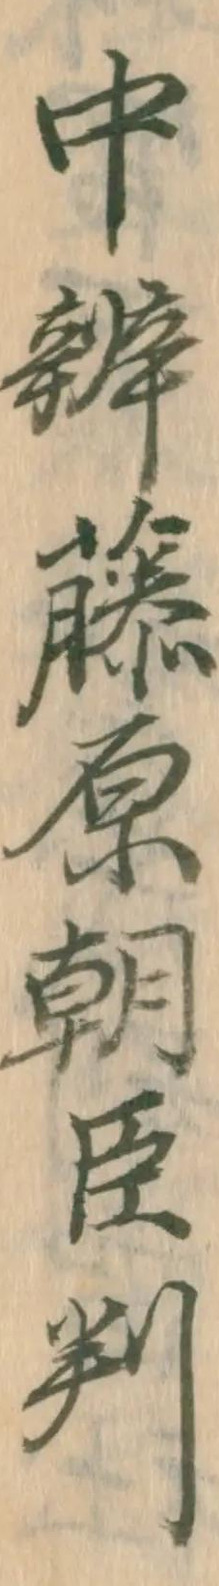中弁藤原朝臣判
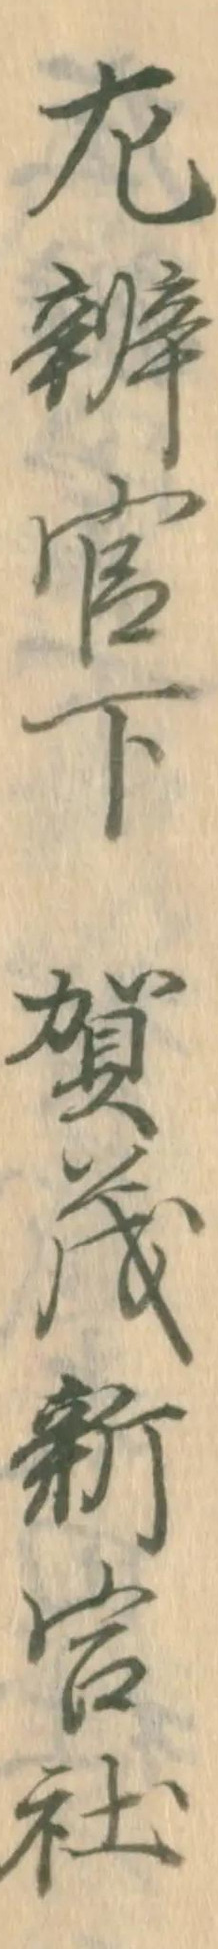左弁官下賀茂新宮社
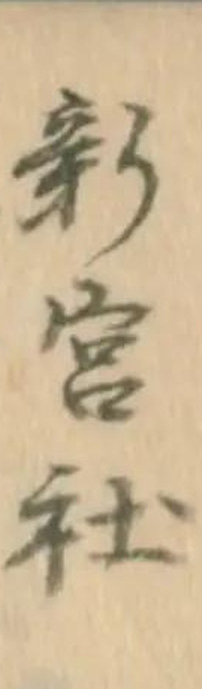新宮社
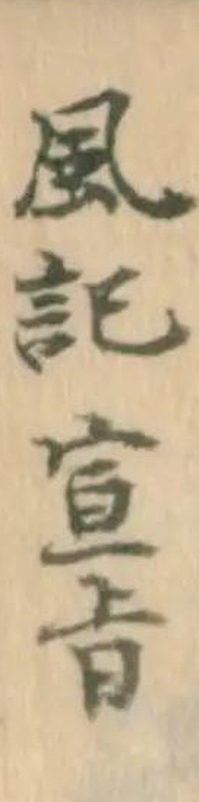風記宣旨
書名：賀茂社記録. 第16冊
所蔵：国立国会図書館 National Diet Library, JAPAN
